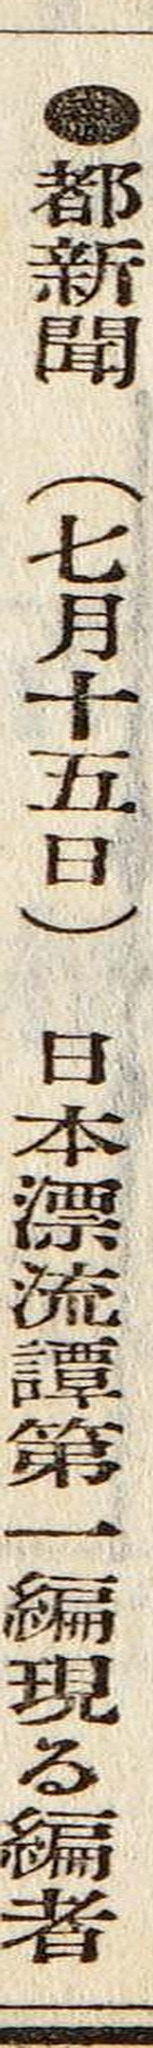●都新聞(七月十五日)日本漂流譚第一編現る編者
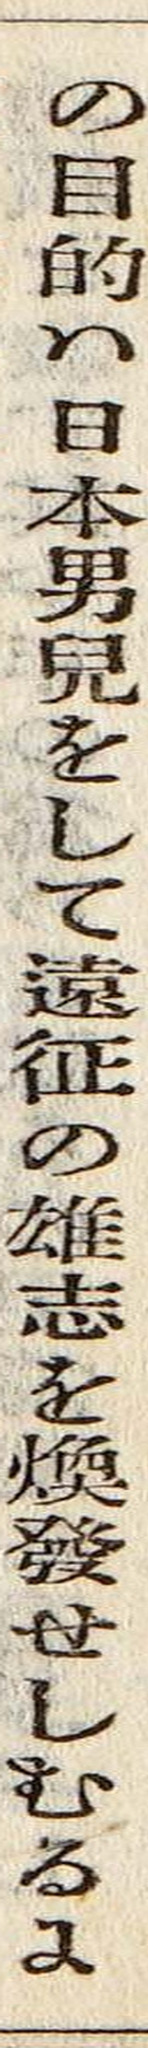の目的は日本男児をして遠征の雄志を煥発せしむるに
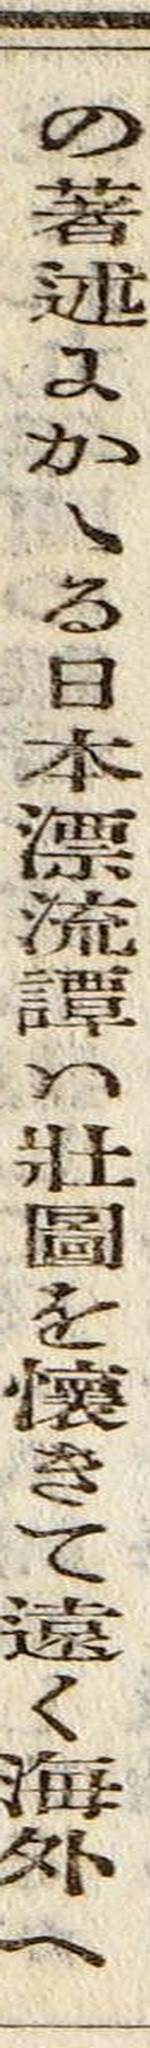の著述にかゝる日本漂流譚は壮図を懐きて遠く海外へ
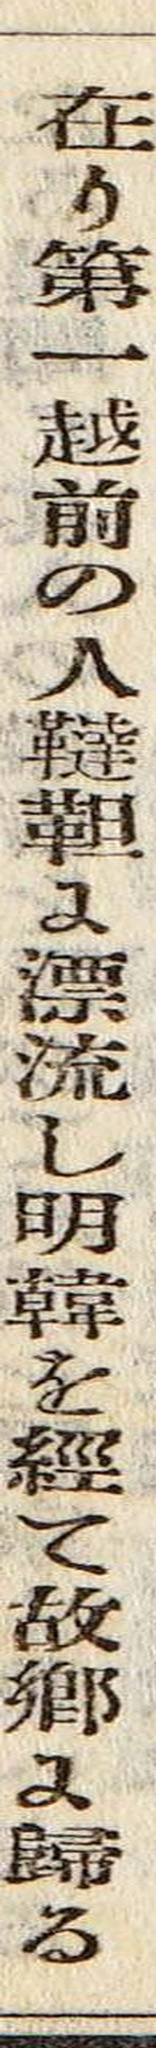在り第一越前の人韃靼に漂着し明韓を経て故郷に帰る
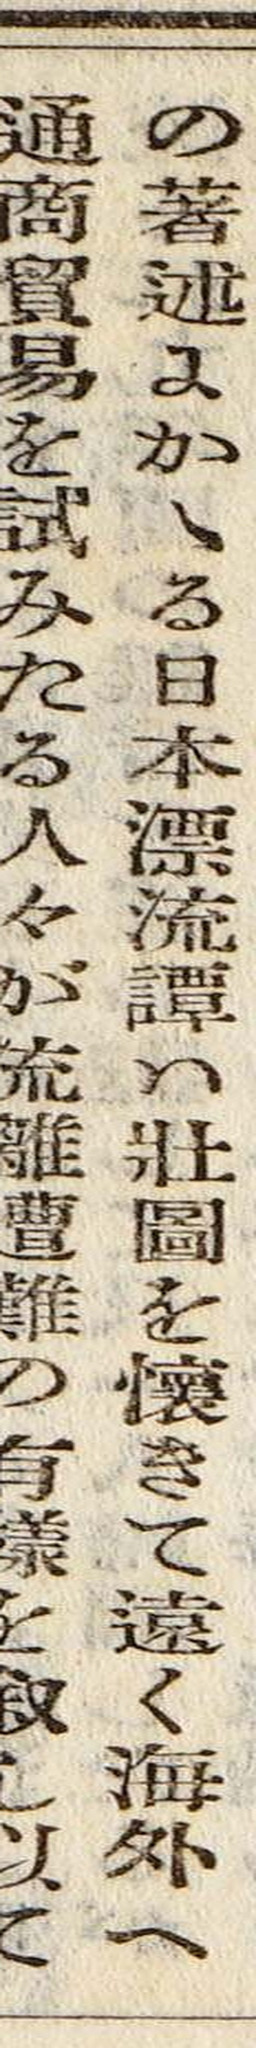通商貿易を試みたる人々が流離遭難の有様を叙し以て
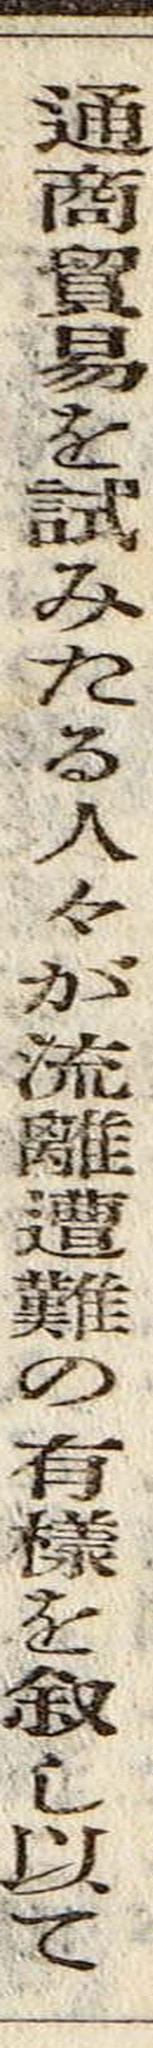通商貿易を試みたる人々が流離遭難の有様を叙し以て
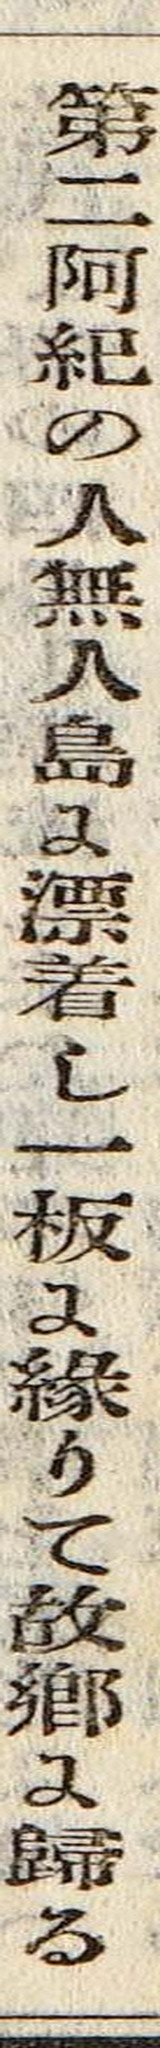第二安紀の人無人島に漂着し一板に緣りて故郷に帰る
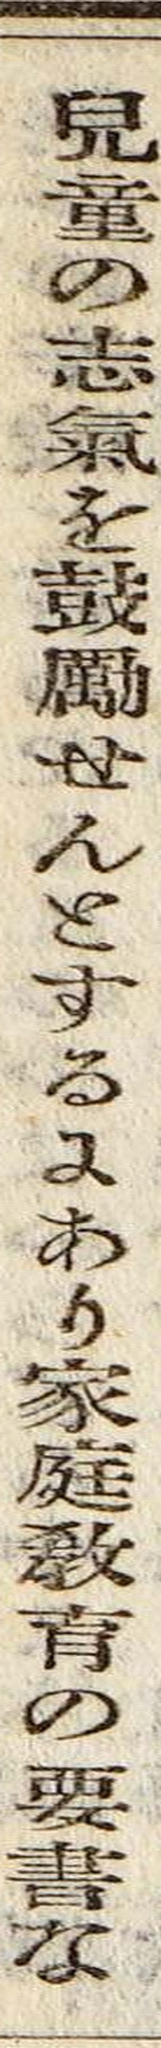児童の士気を鼓励せんとするにあり家庭教育の要書な
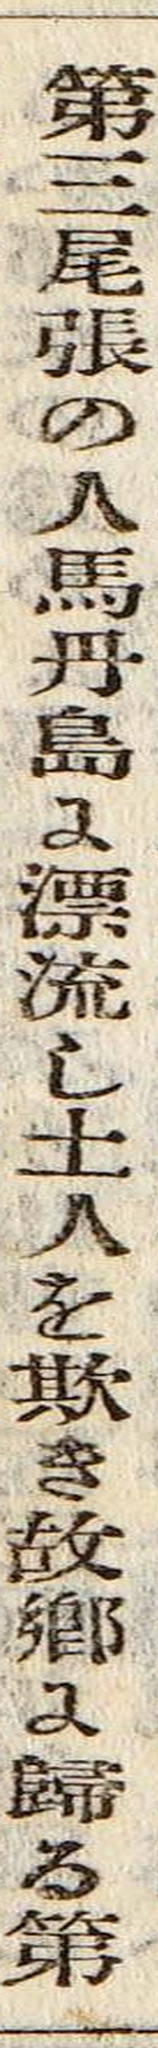第三尾張の人馬丹島に漂流し土人を欺き故郷に帰る第
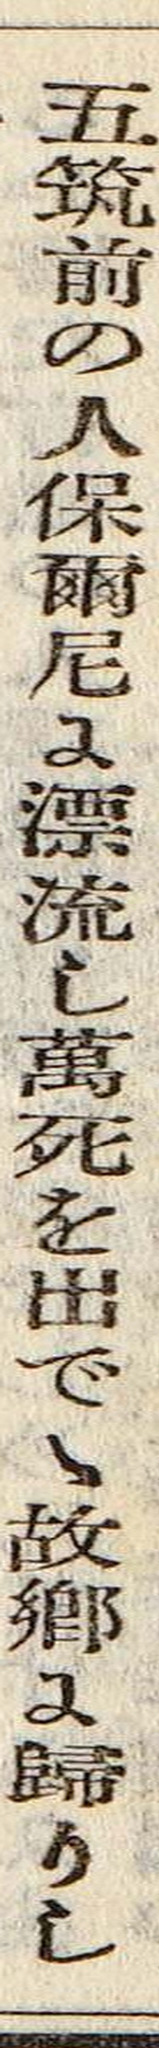五筑前の人保爾尼に漂流し萬死を出でゝ故郷に帰りし
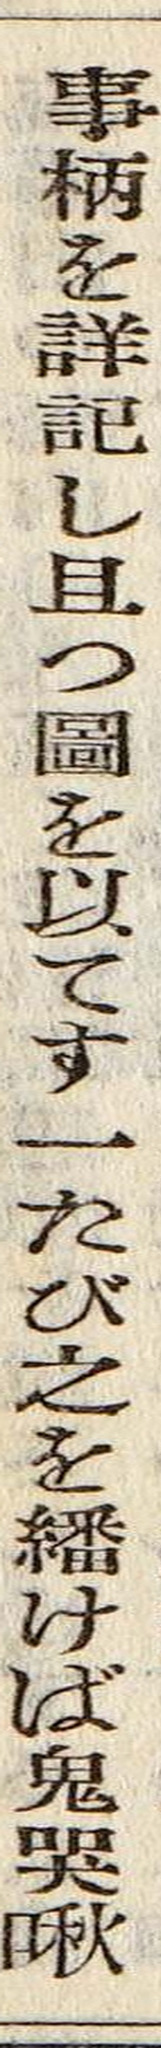事柄を詳記し且つ図を以てす一たび之を繙けば鬼哭啾
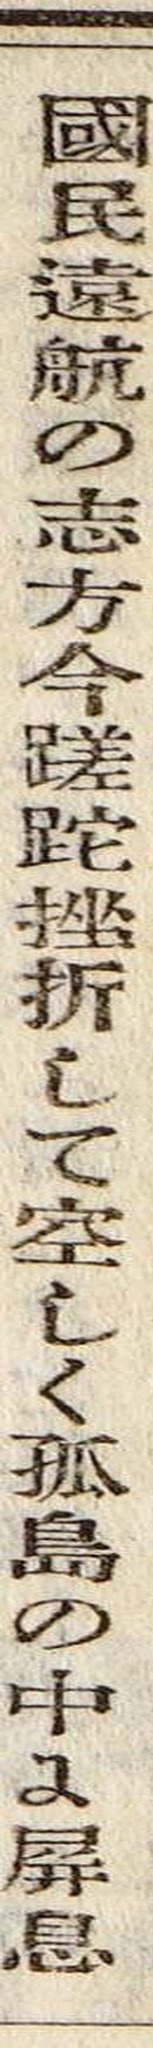国民遠航の志方今蹉跎挫折して空しく孤島の中に屏息
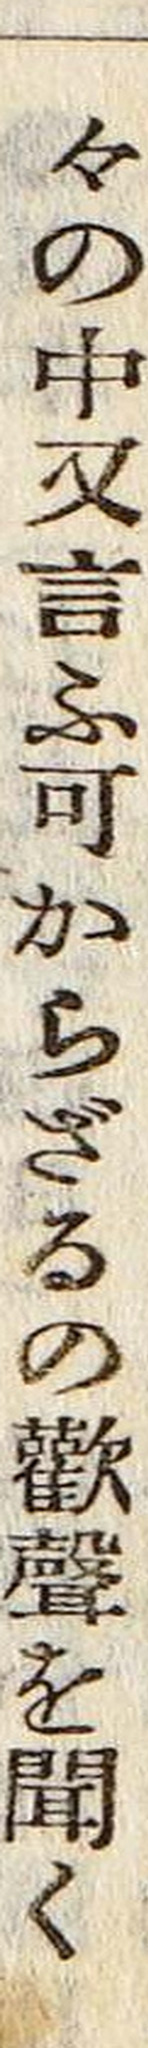々の中又言う可からざるの歓声を聞く
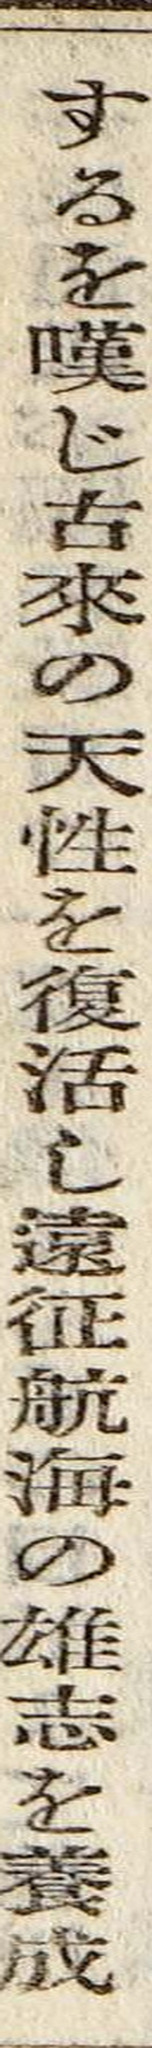するを嘆じ古来の天性を復活し遠征航海の雄志を養成
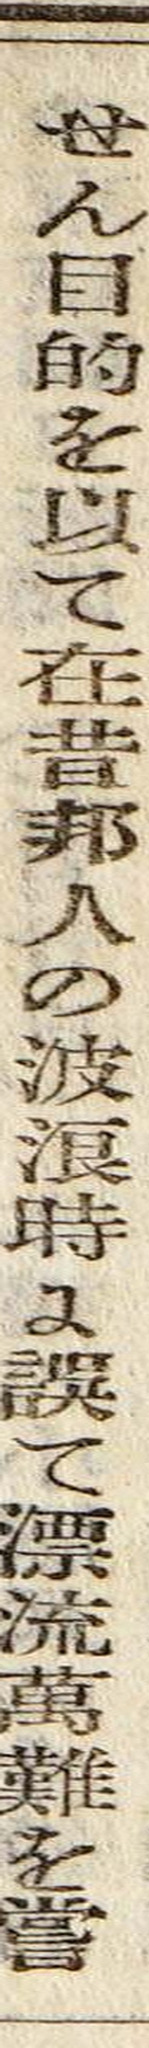せん目的を以て在昔邦人の波浪時に誤て漂流萬難を嘗
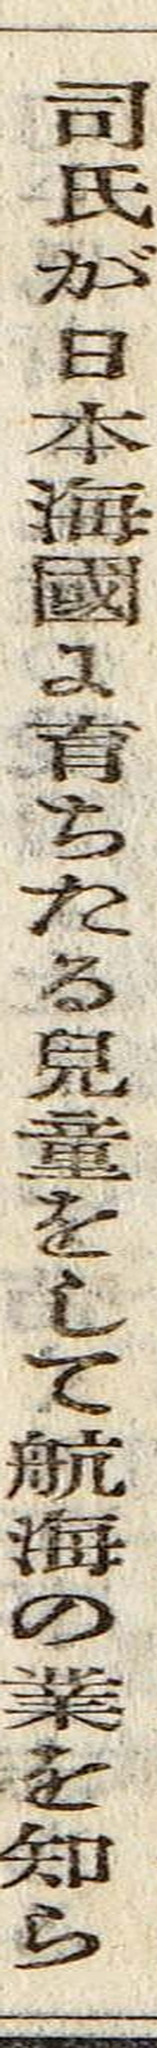司氏が日本海国に育ちたる児童をして航海の業を知ら
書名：日本漂流譚
